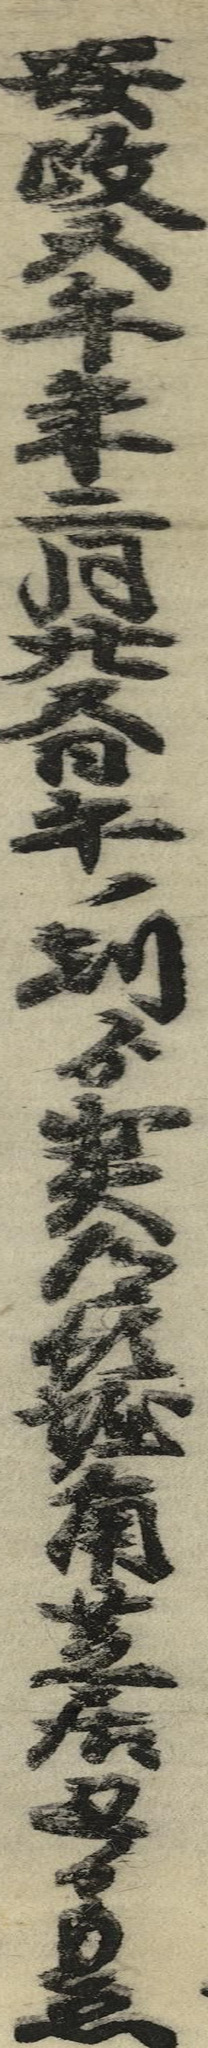安政五午年二月廿五日午ノ刻ゟ出火道頓堀角芝居辺ゟもゑ
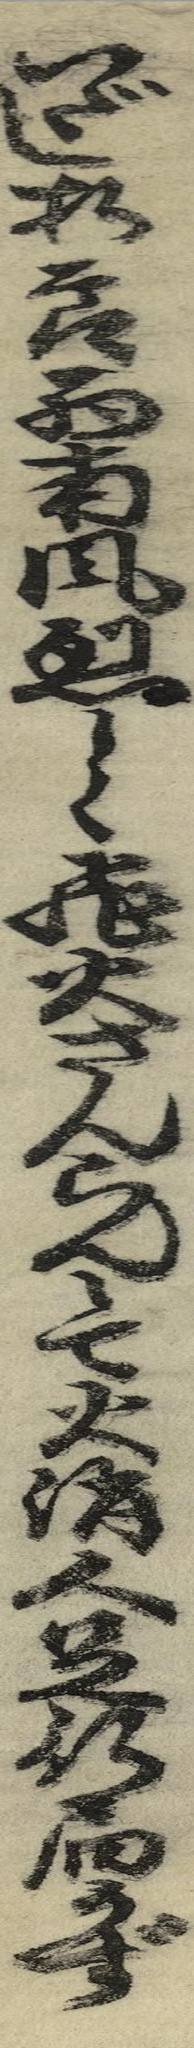いだし折節西南風烈しく飛火さんらんして火消人足行届かず
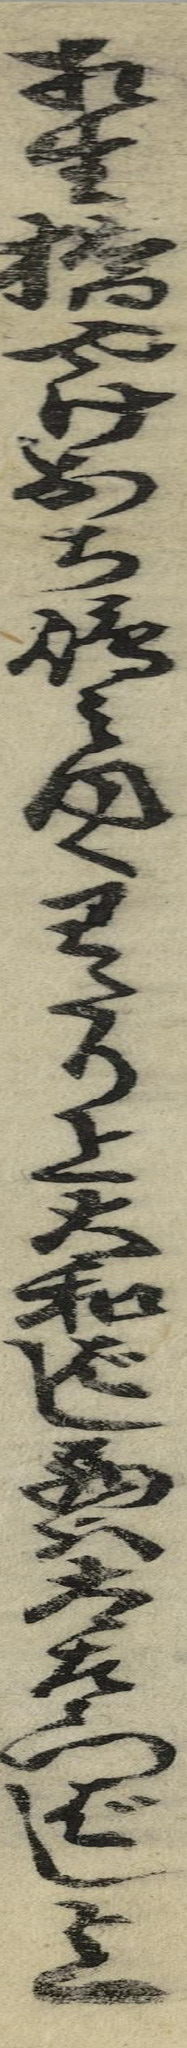相生橋やけおち嶋之内へわたり上大和ばし西は太左衛門ばし迄
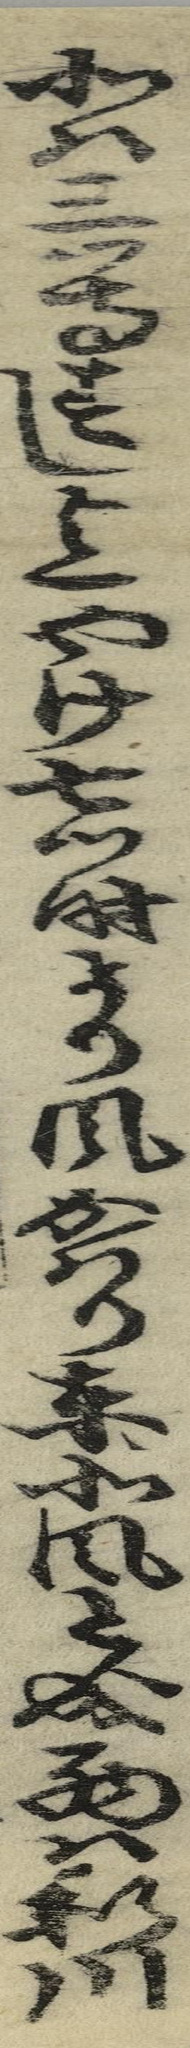北は三ツ寺はし迄やけ七ツ時より風かはり東北風と成西は新川
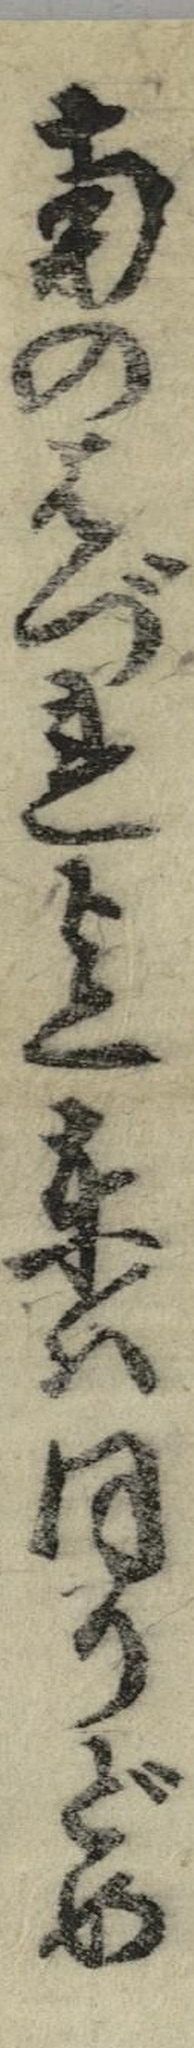南のはづれ迄東はほりどめ
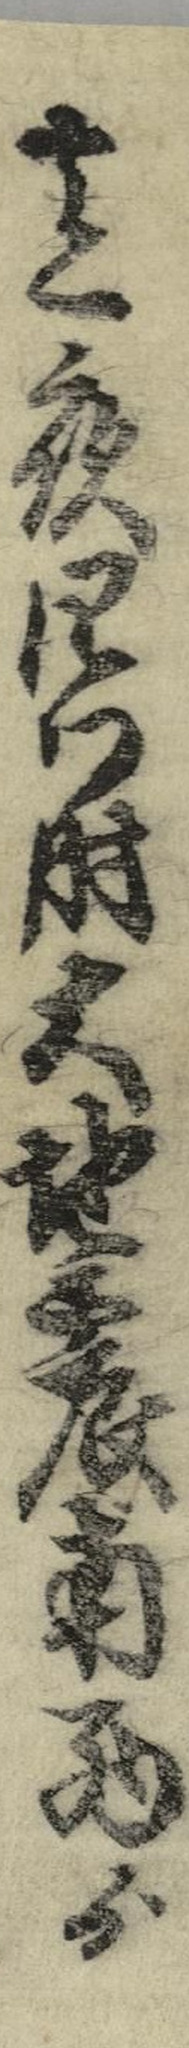其上夜四ツ時大地震南西ゟ
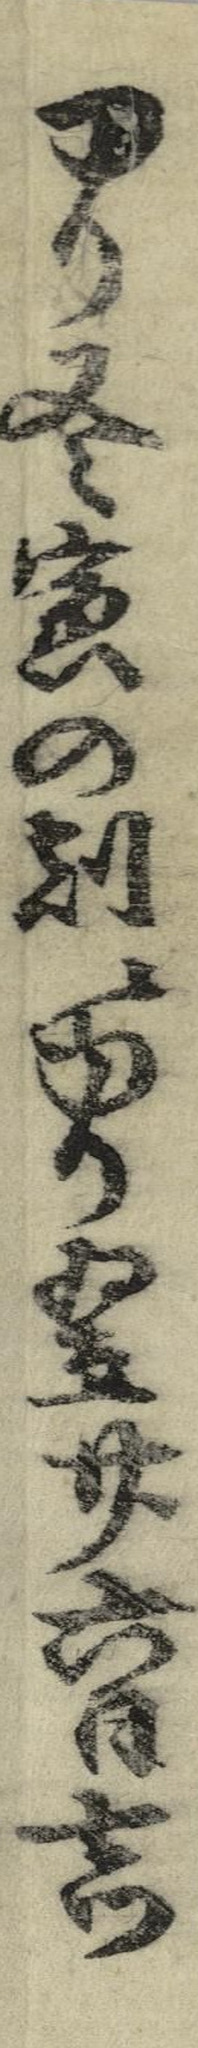ゆり又〻寅の刻にゆり翌廿六日七ツ
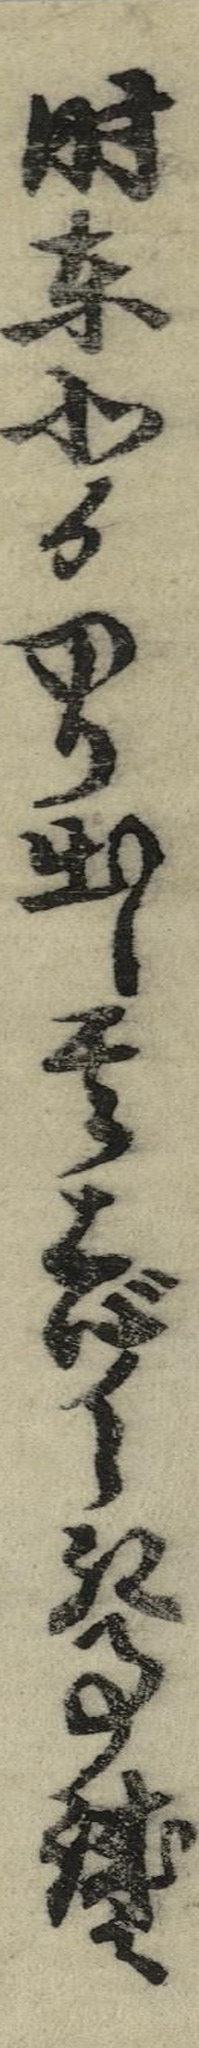時東北ゟゆり出し其はげしき事誠に
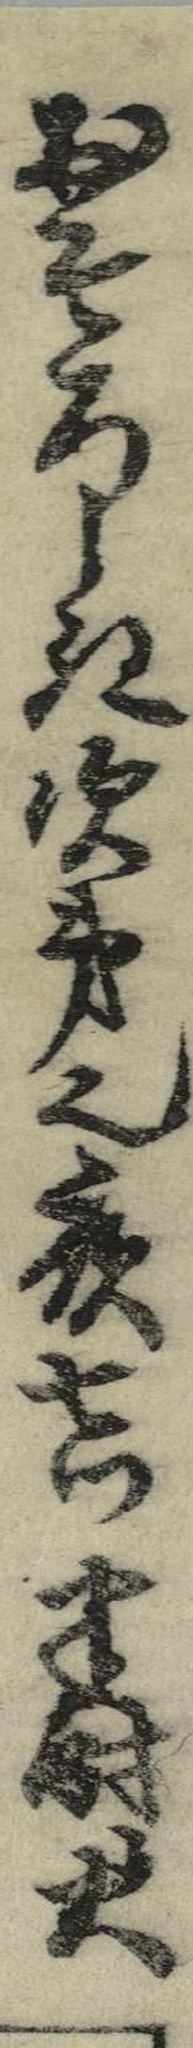おそろしき次第也夜七ツ半時火
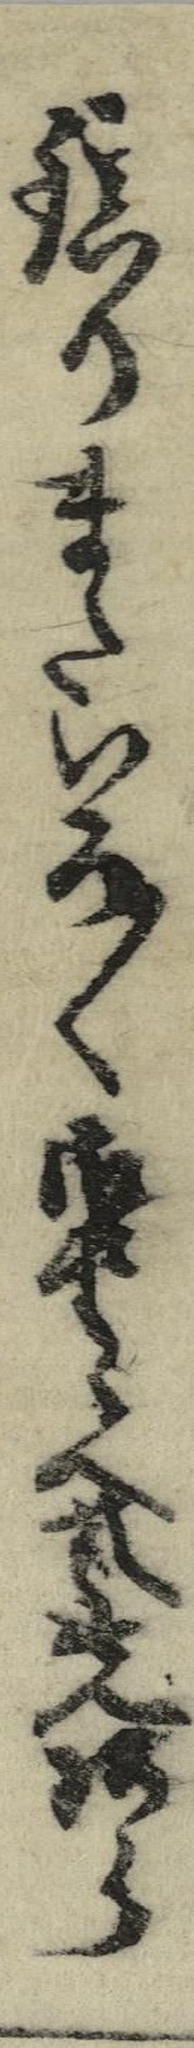鎮りまたいろ〳〵御座候へ共先あら
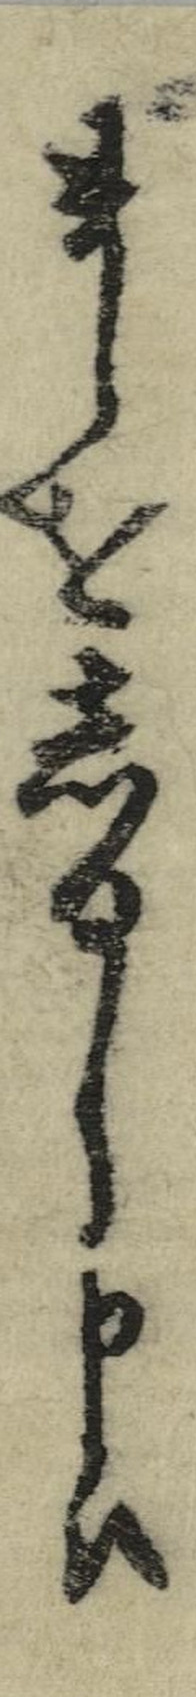ましをしるし申候
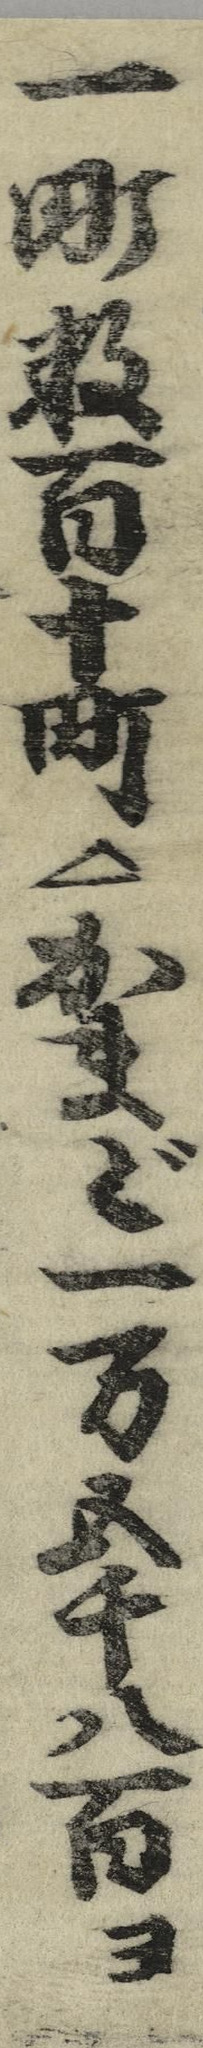一町数百十町△かまど一万五千八百ヨ
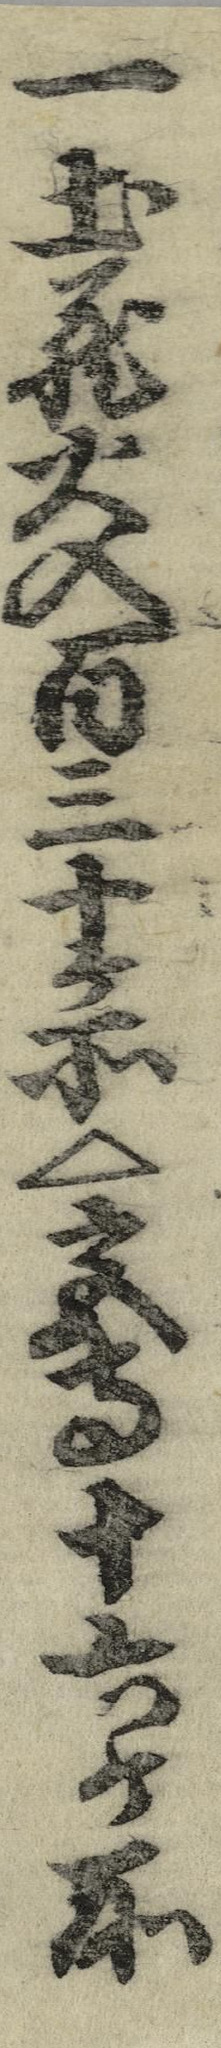一土蔵火入百三十ケ所△宮寺十六ケ所
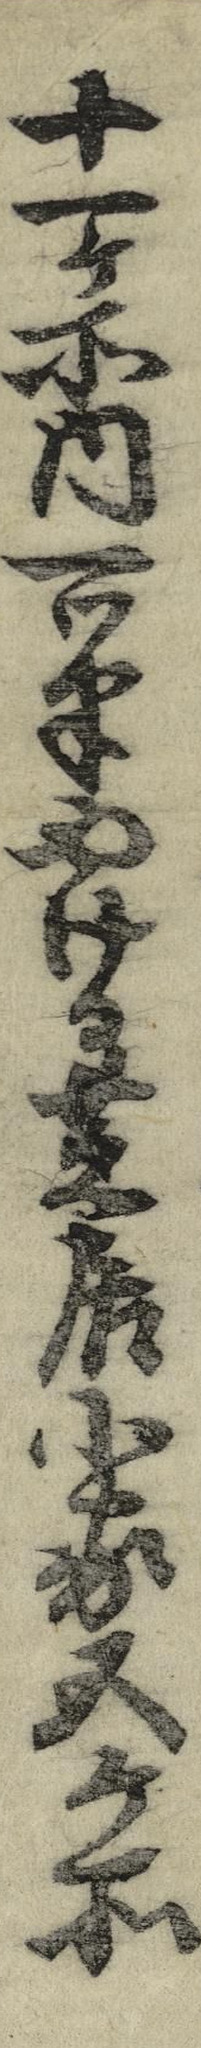十一ケエ所内一ツ半やける芝居小家五ケ所
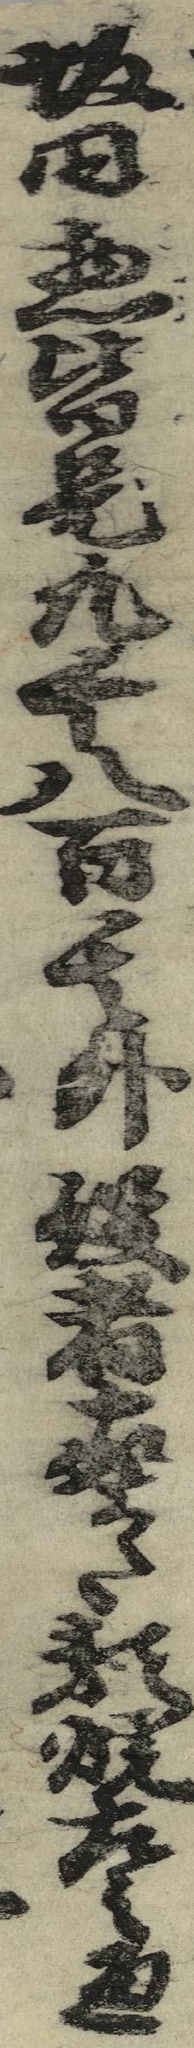坂田惣皆是九千八百其外役者衆かた類焼左之通
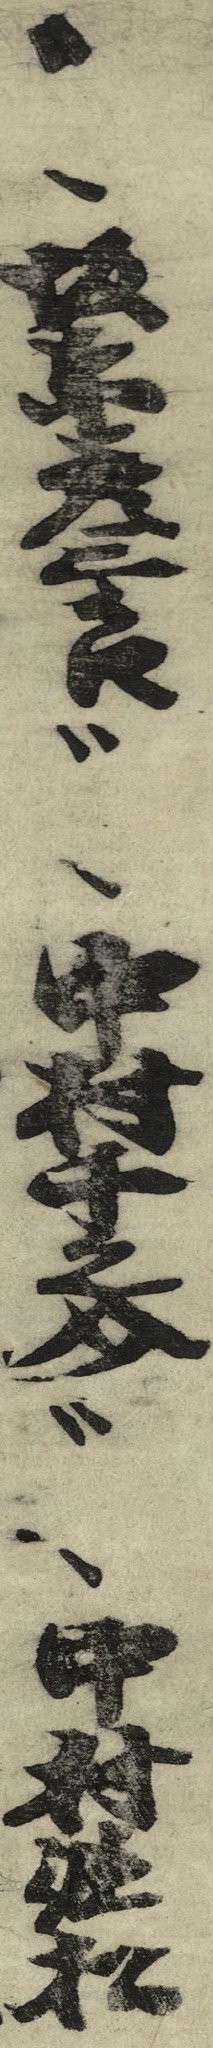〃ヽ坂東彦三郎〃ヽ中村千之介〃ヽ中村徳松
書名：のこらず本しらべ大阪　大火細見本しらべ
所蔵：東京大学地震研究所図書室 Earthquake Research Institute Library, The University of Tokyo, JAPAN
